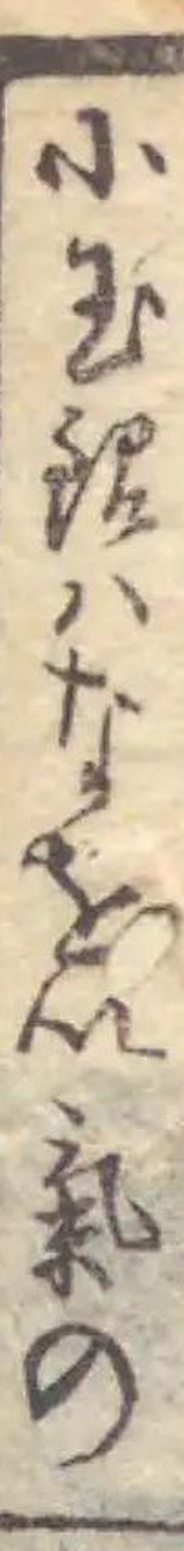小玉銀はなを以気の
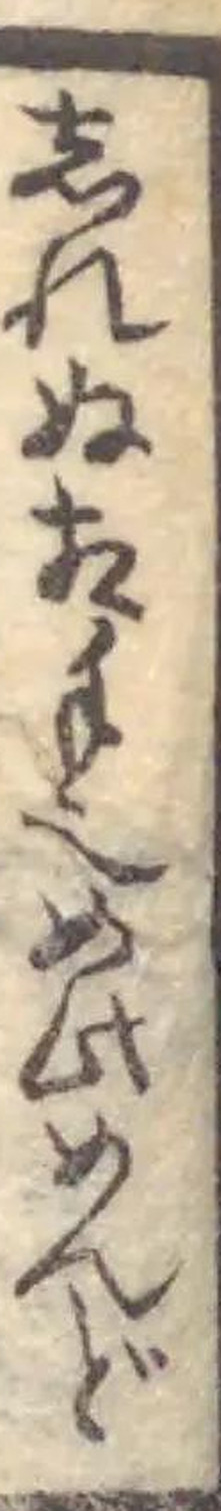知れぬ相手也如此めんど
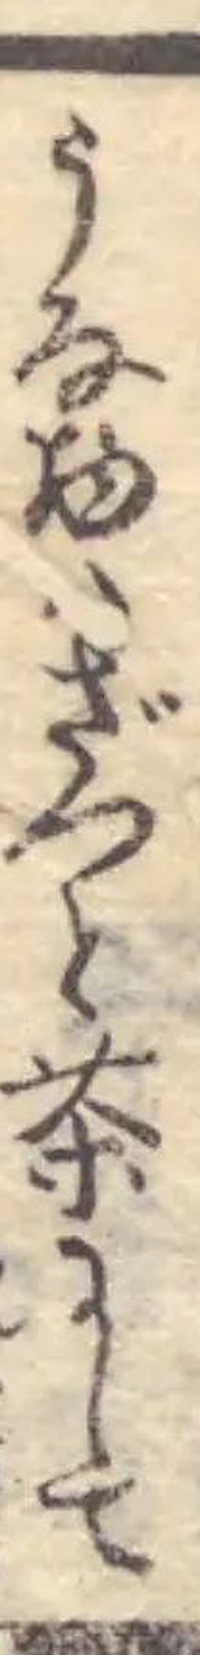うな物はざつと茶にして
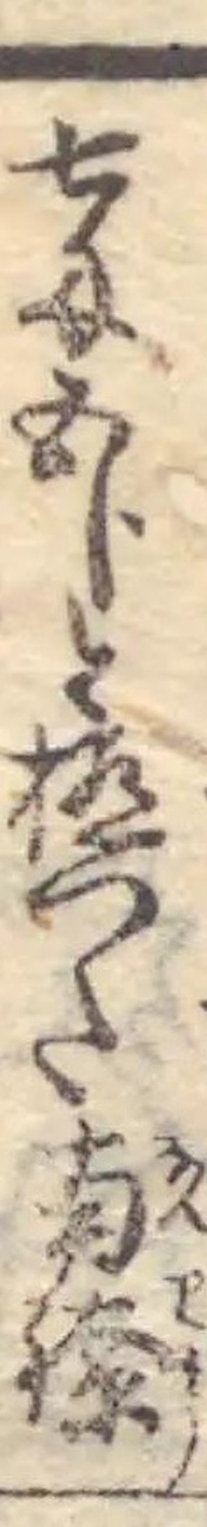七匁五分と極つた南鐐
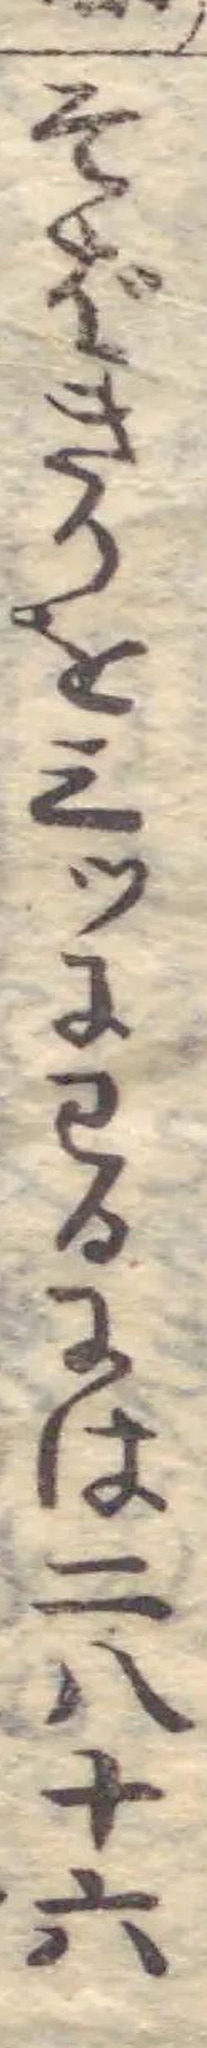そばきりを三つにわるには二八十六
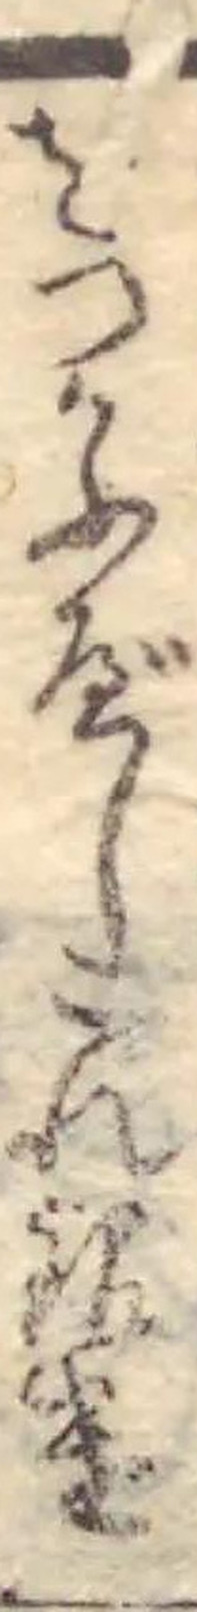をつかふべしこれ銀遣
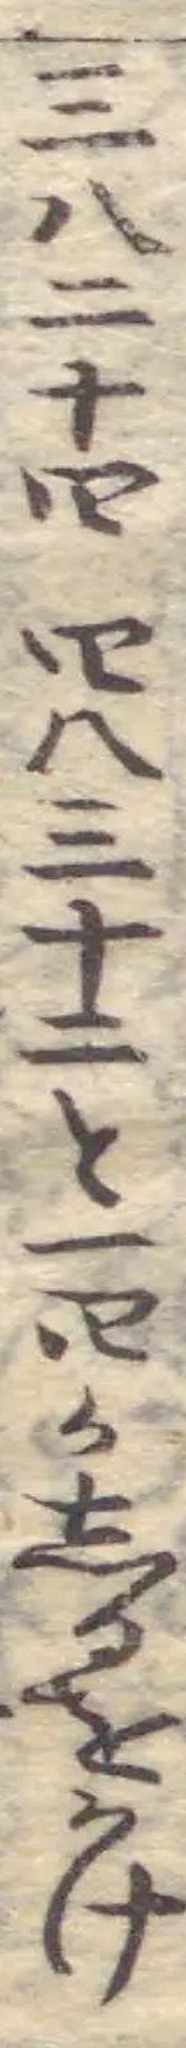三八二十四四八三十二と一四がしるをかけ
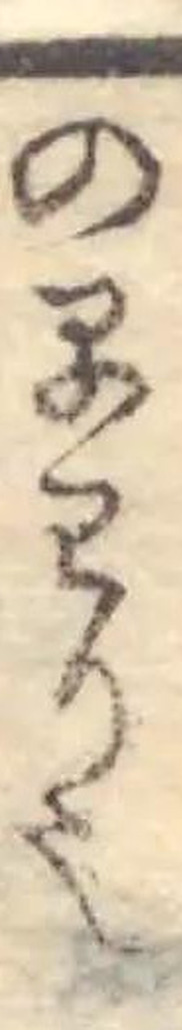の早わり也
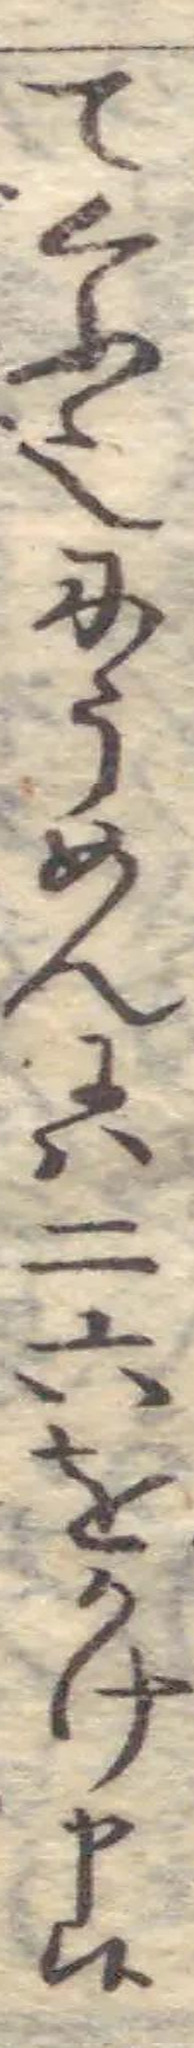てくふ也にうめんには二六をかけ申候
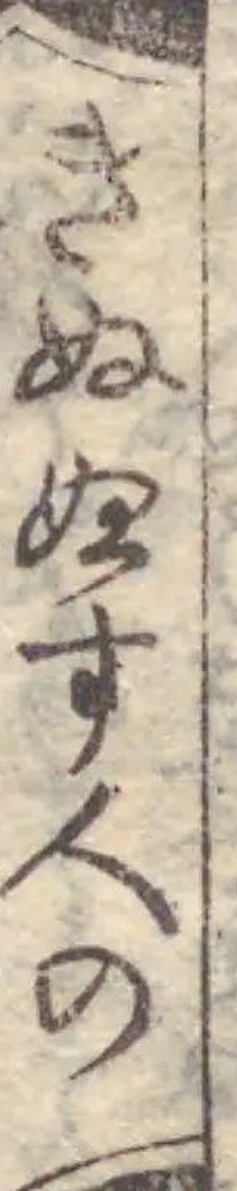『きぬぬす人の
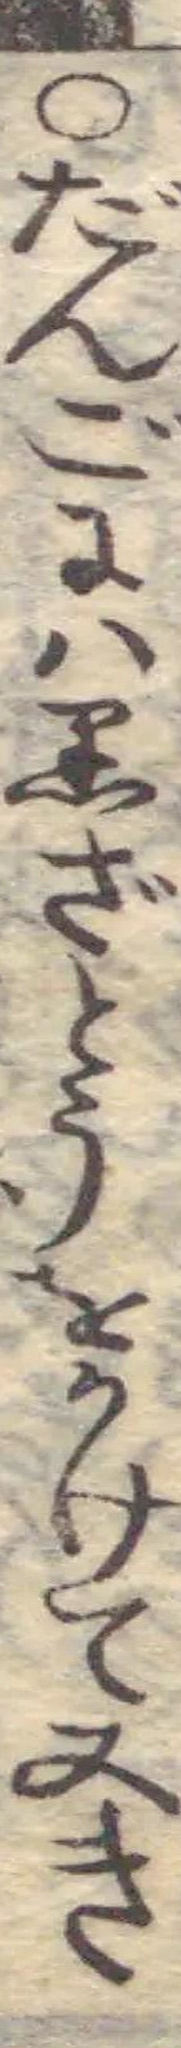○だんごには黒ざとうをかけて又き
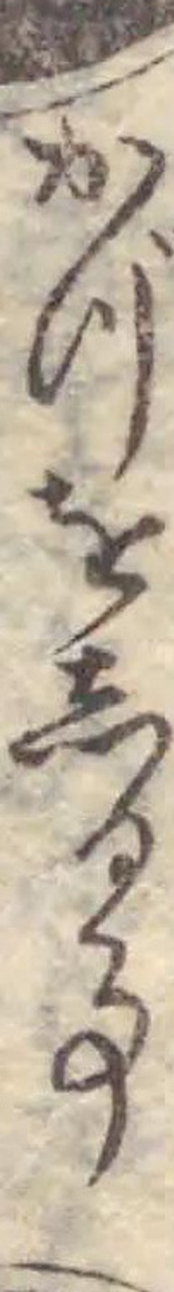かづをしる事』
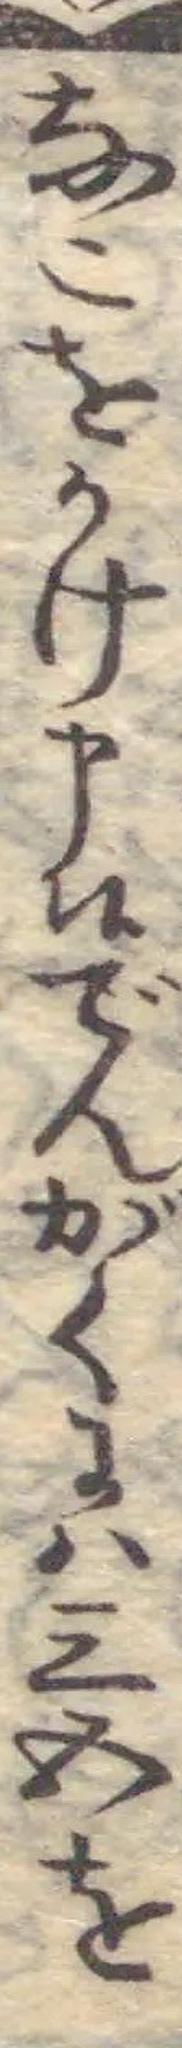なこをかけ申候でんがくには三五を
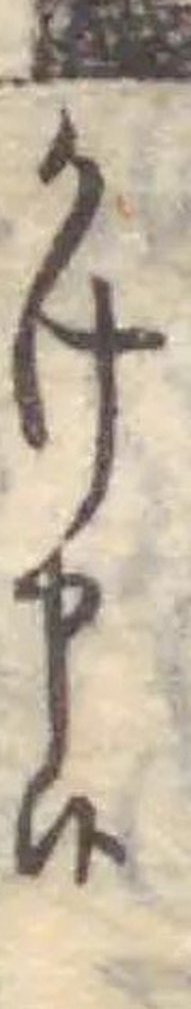かけ申候
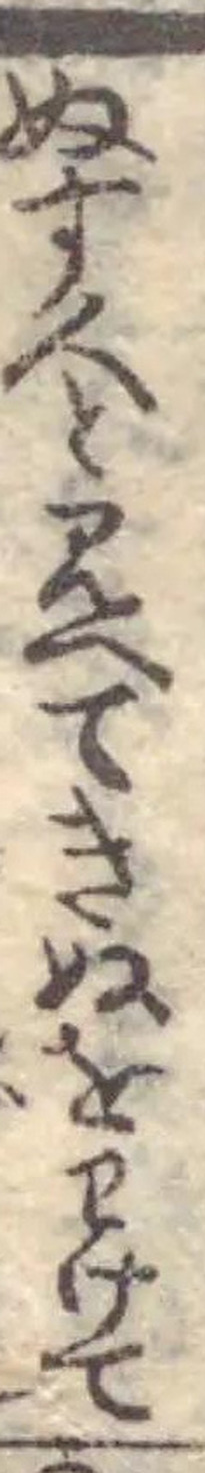ぬす人と見へてきぬをわけて
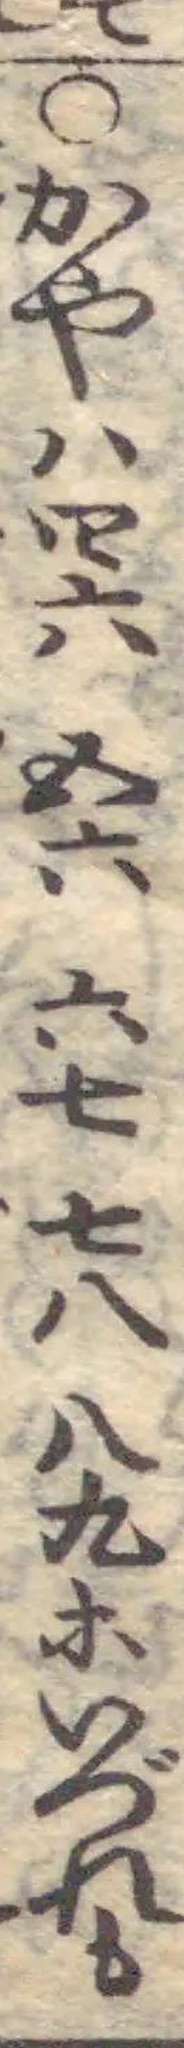○かやは四六五六六七七八八九等いづれも
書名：大通人好記
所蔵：国立国会図書館 National Diet Library, JAPAN
